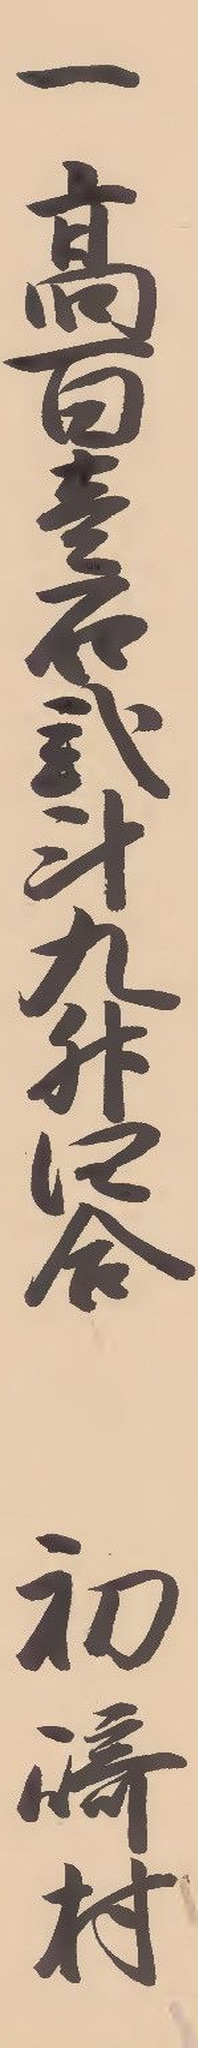一髙百壱石弐斗九升四合初崎村
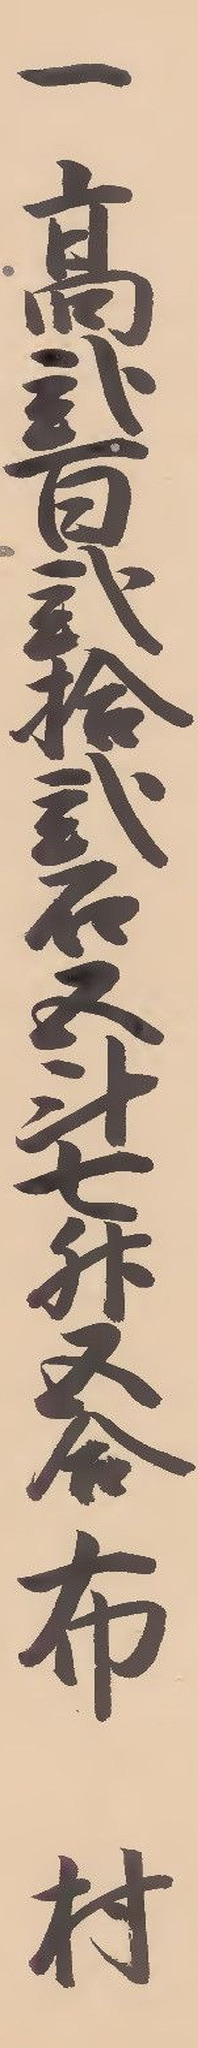一髙弐百弐拾弐石五斗七升五合布村

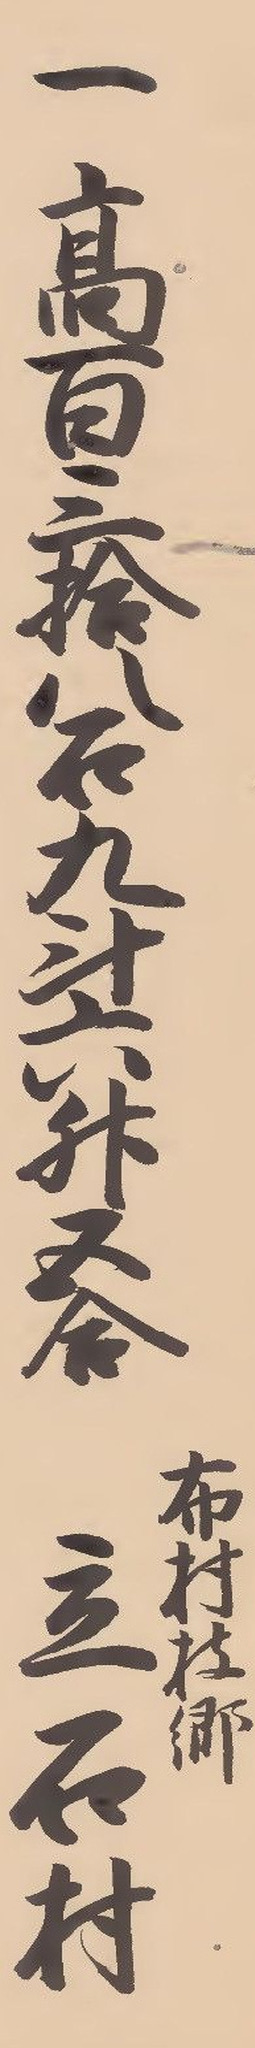一髙百三拾八石九斗六升五合立石村
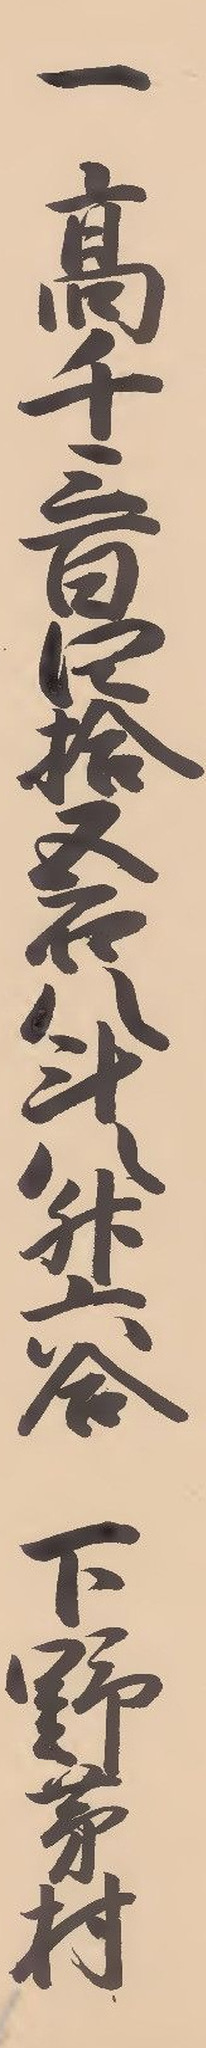一髙千三百四拾五石八斗八升六合下野茅村
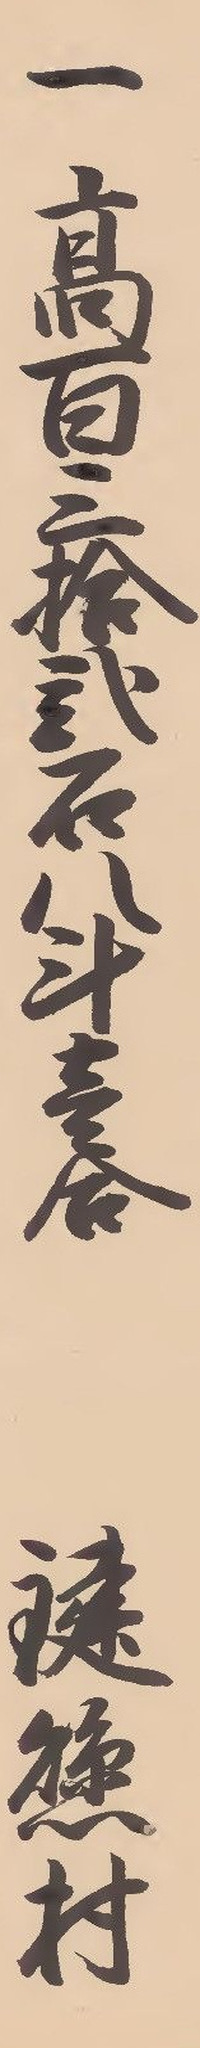一髙百三拾弐石八斗壱合鍵懸村
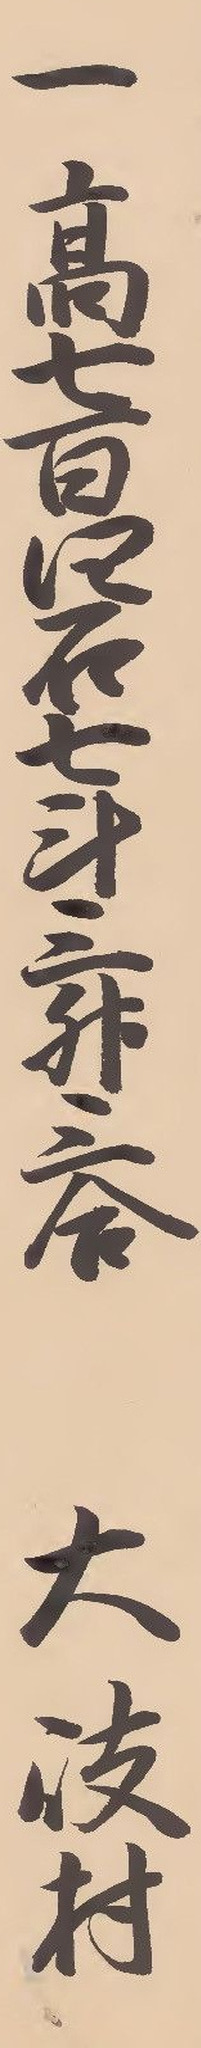一髙七百四石七斗三升三合大岐村
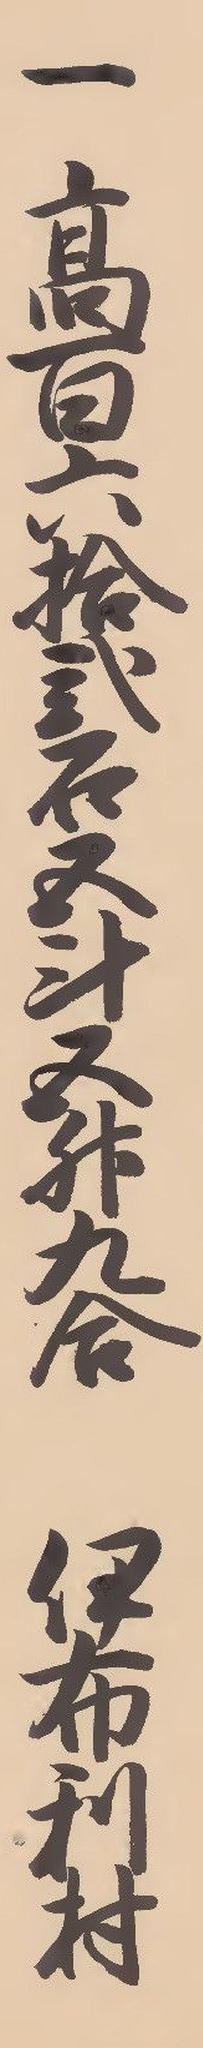一髙百六拾弐石五斗五升九合伊布利村
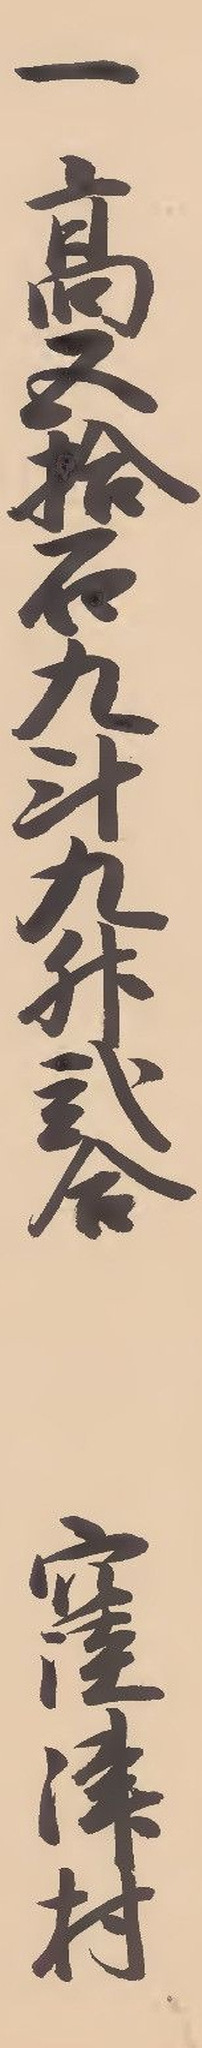一髙五拾石九斗九升弐合窪津村
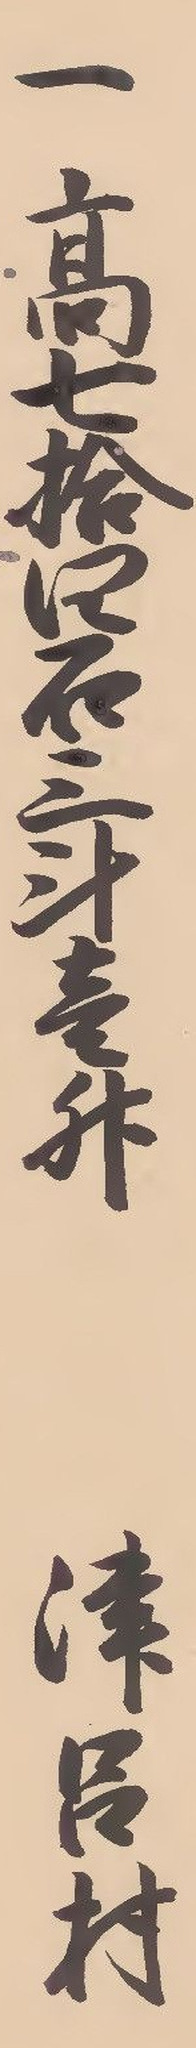一髙七拾四石三斗壱升津呂村

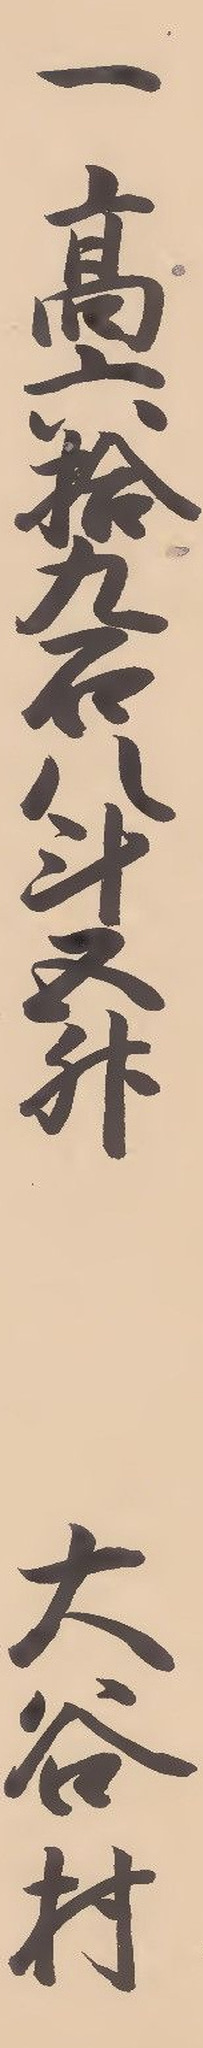一髙六拾九石八斗五升大谷村
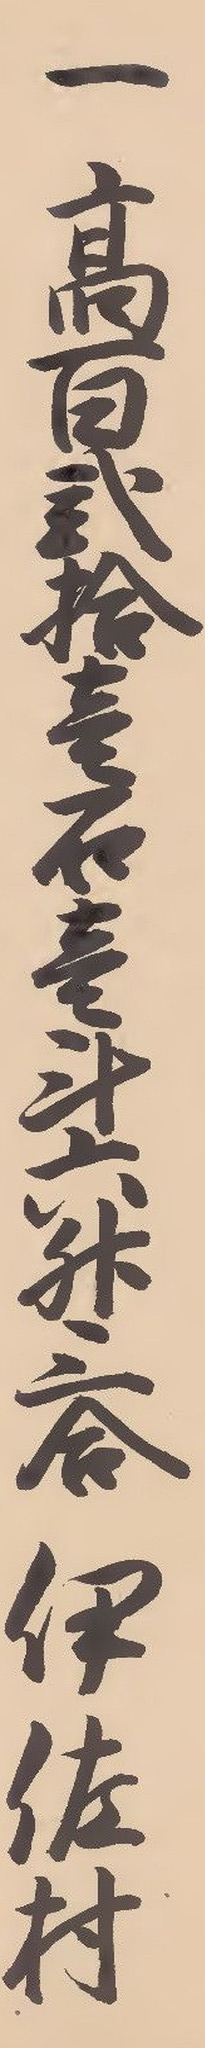一髙百弐拾壱石壱斗六升三合伊佐村
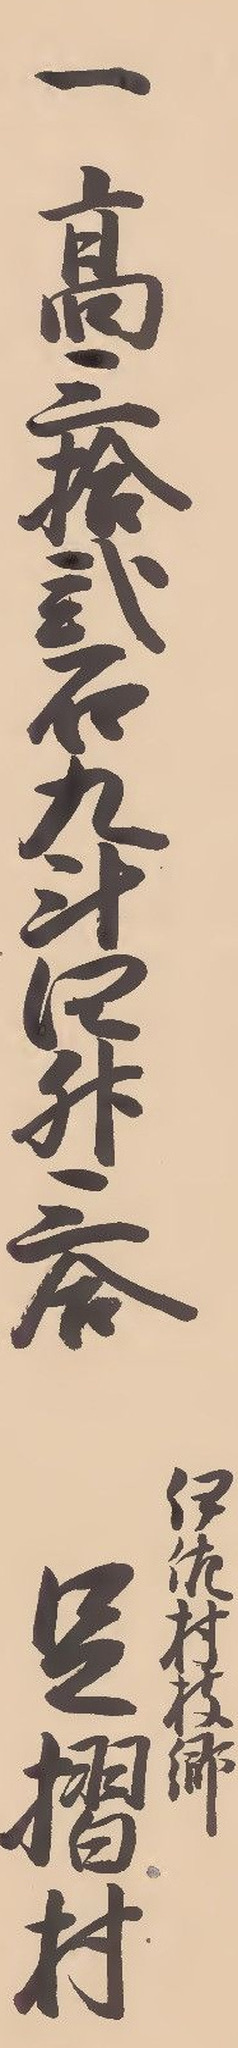一髙三拾弐石九斗四升三合足摺村
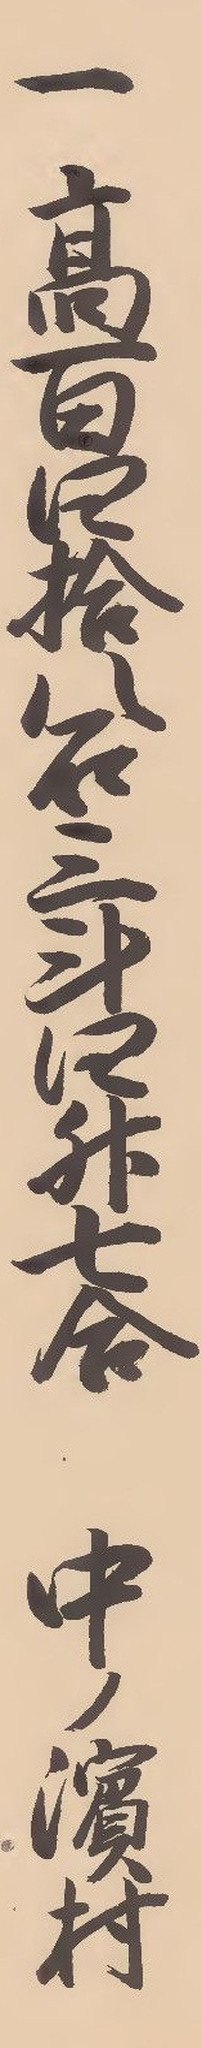一髙百四拾八石三斗四升七合中ノ濱村
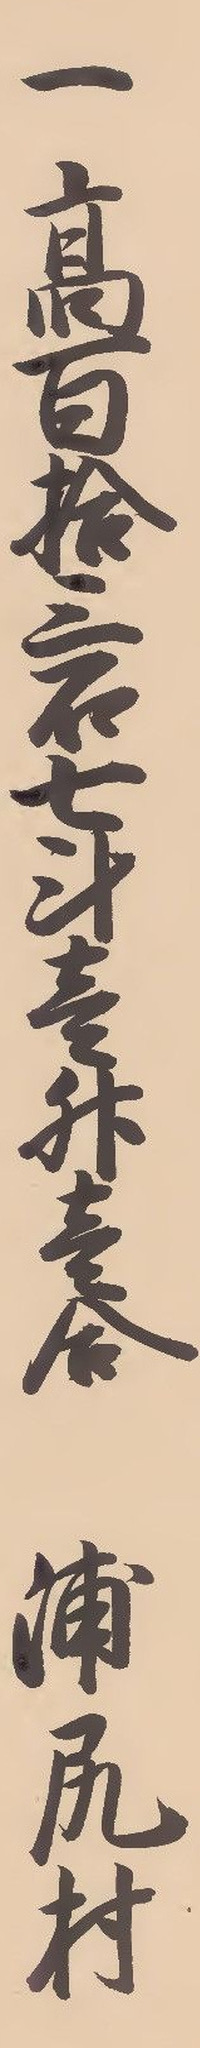一髙百拾三石七斗壱升壱合浦尻村
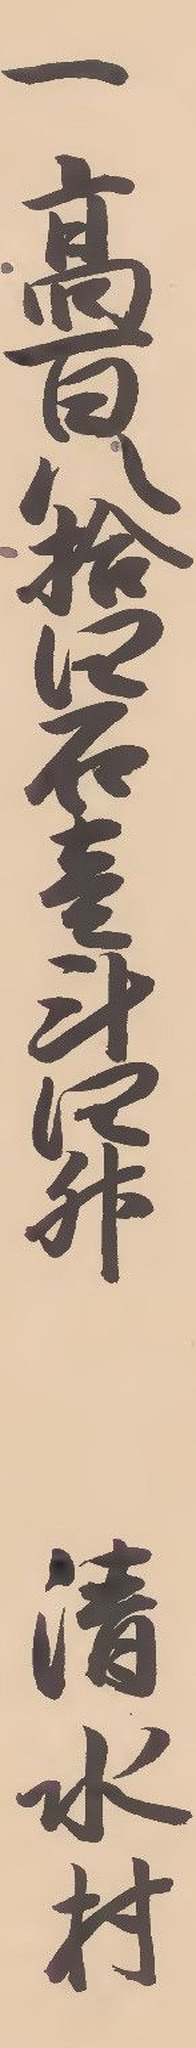一髙百八拾四石壱斗四升清水村

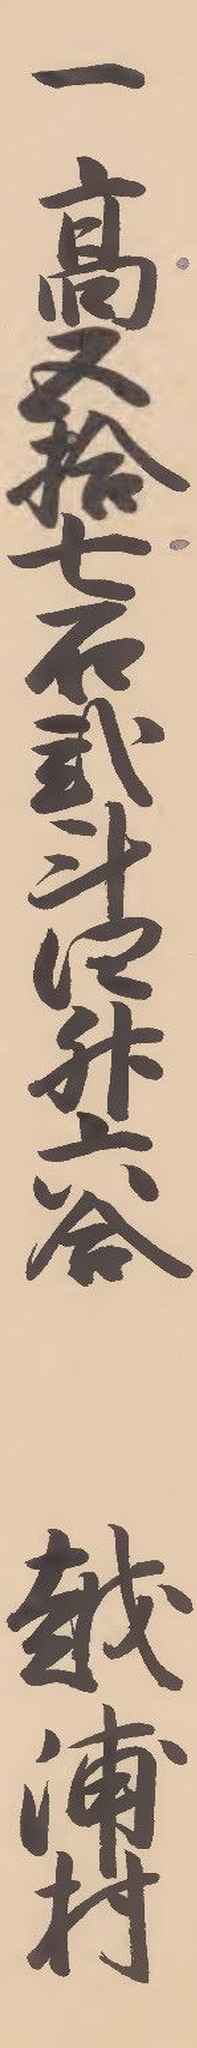一髙五拾七石弐斗四升六合越浦村
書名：土佐国郷帳
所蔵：国立公文書館 National Archives of Japan
